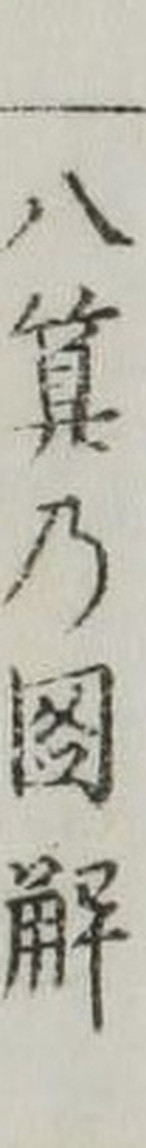八算の図解
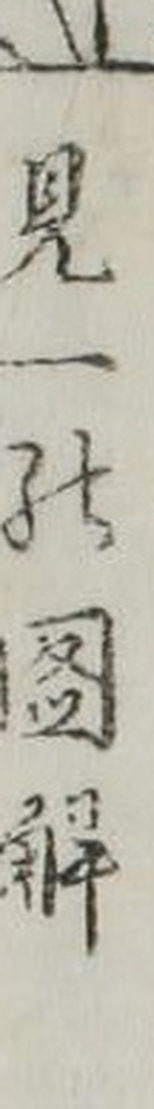見一の図解
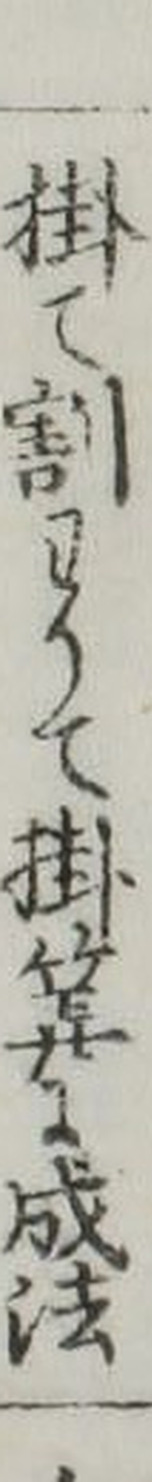掛て割わりて掛算に成法
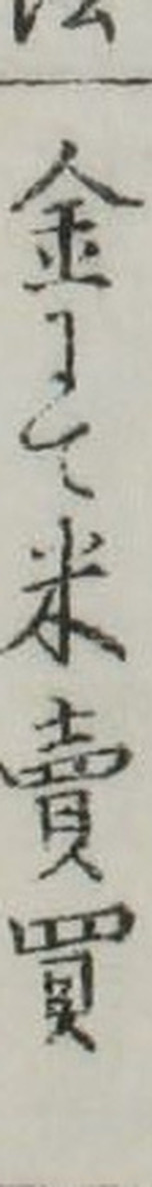金にて米売買
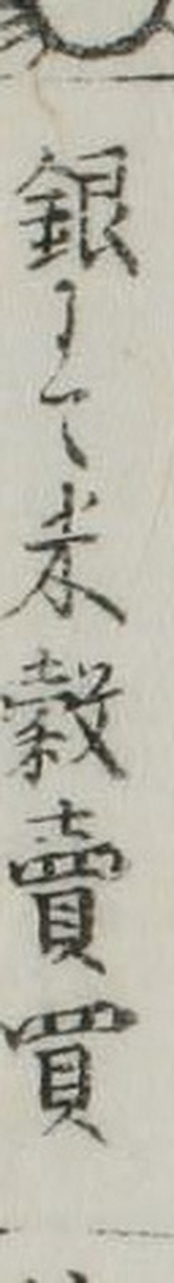銀にて米数売買
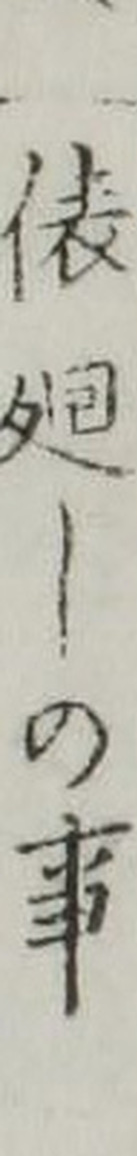俵廻しの事
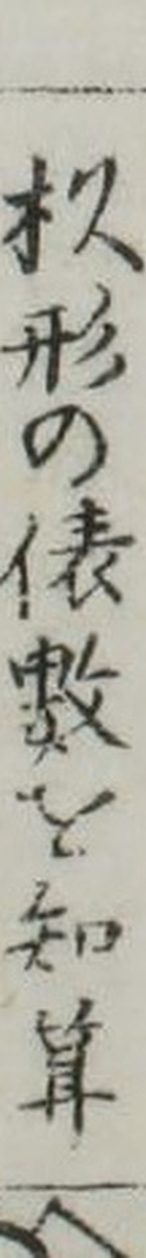杉形の俵数を知算
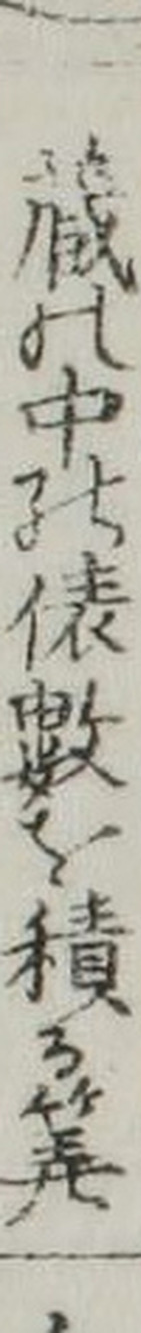蔵の中の俵数を積る算
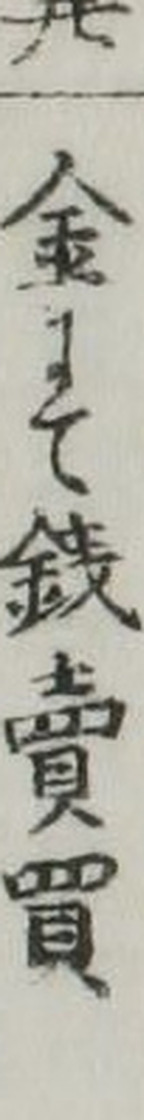金にて銭売買
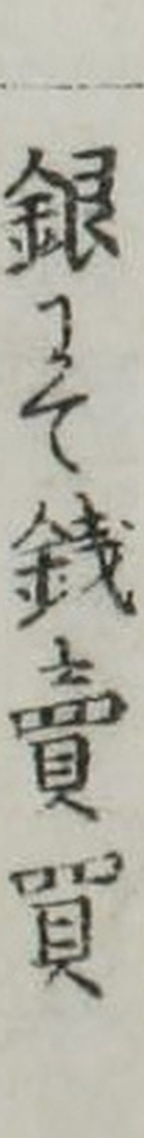銀にて銭売買
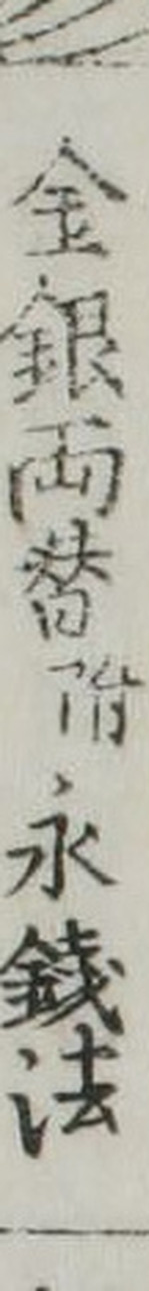金銀両替附永錢法
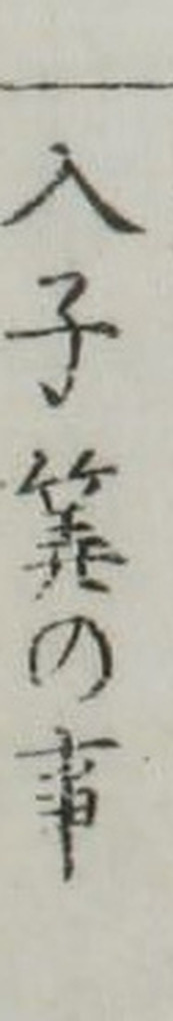入子算の事
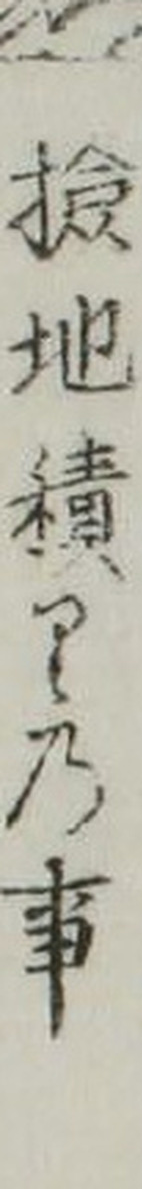撿地積りの事
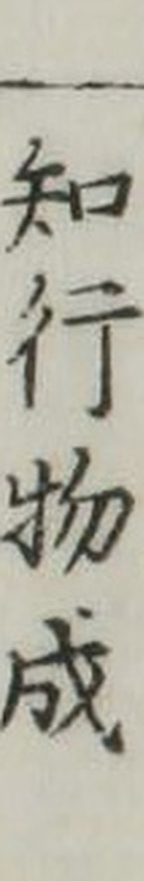知行物成
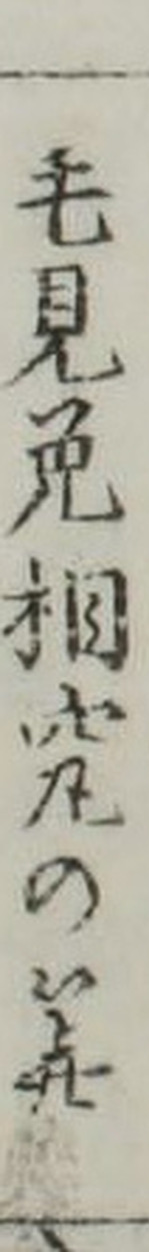毛見免相究の算
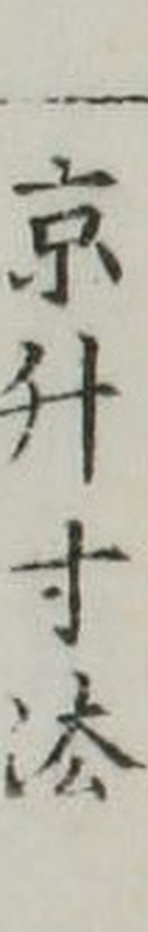京升寸法
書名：宝玉塵劫記
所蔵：東京学芸大学教育コンテンツアーカイブ
